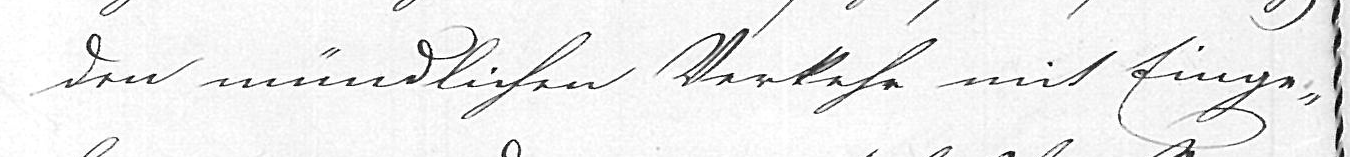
den mündlichen Verkehr mit Einge-
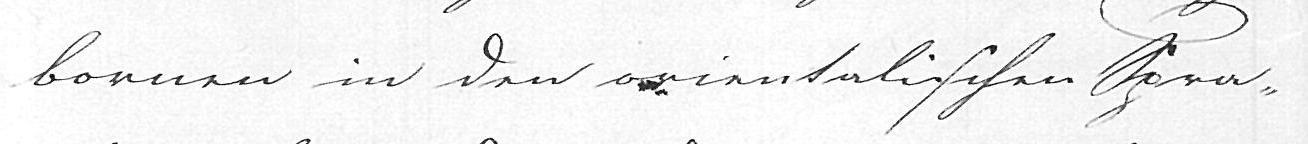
bornen in den orientalischen Spra-
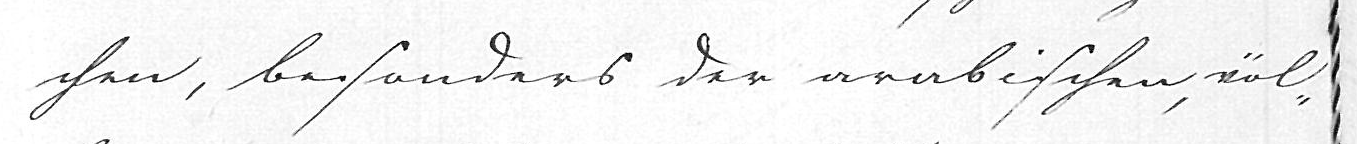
chen, besonders der arabischen völ-
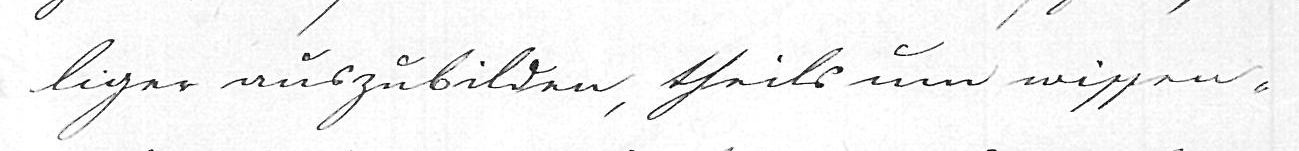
liger auszubilden, theils um wissen-
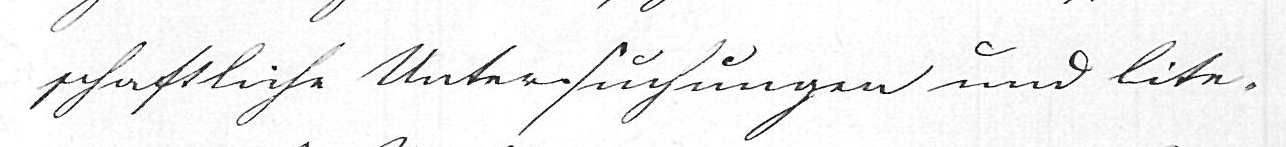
schaftliche Untersuchungen und lite-
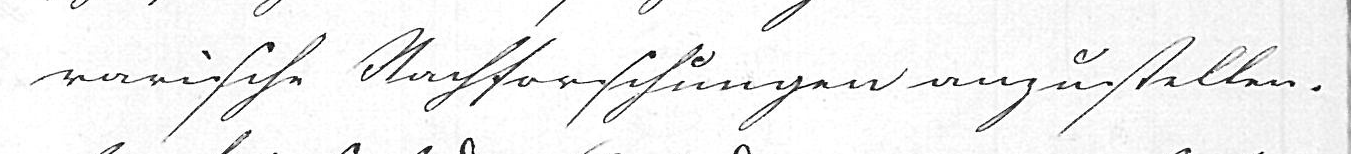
rarische Nachforschungen anzustellen.
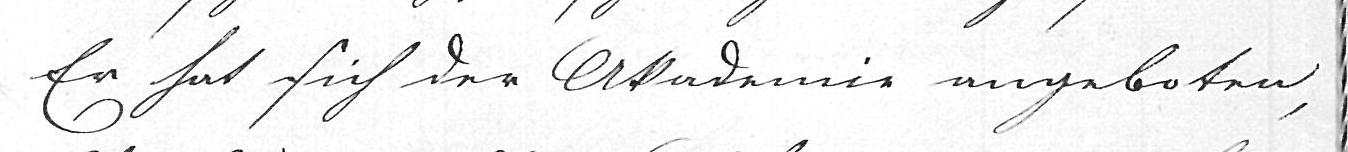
Er hat sich der Akademie angeboten,
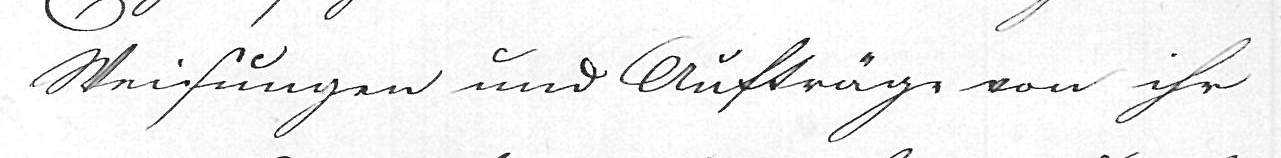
Weisungen und Aufträge von ihr
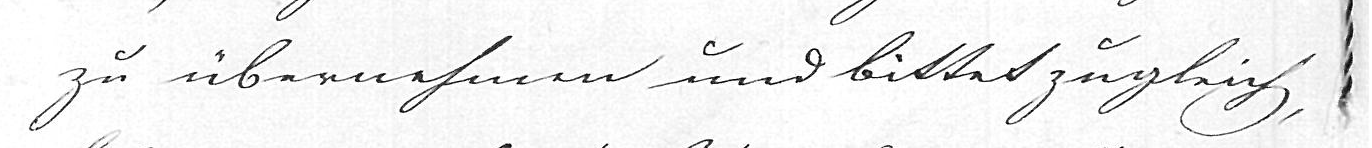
zu übernehmen und bittet zugleich,
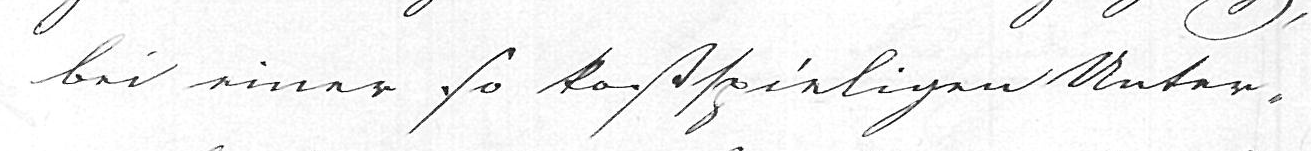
bei einer so kostspieligen Unter-
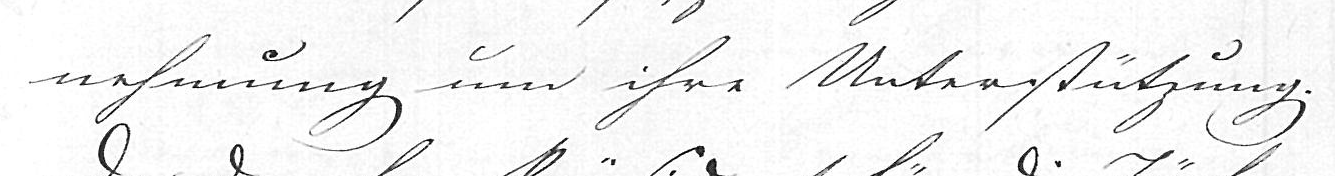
nehmung um ihre Unterstützung.
